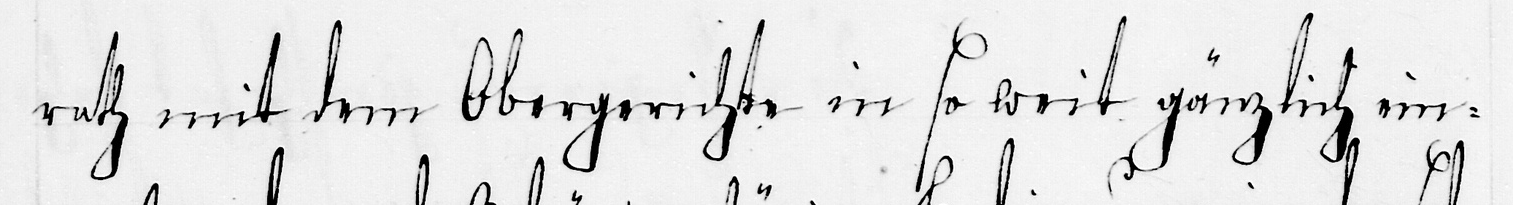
rath mit dem Obergerichte in so weit gänzlich ein¬
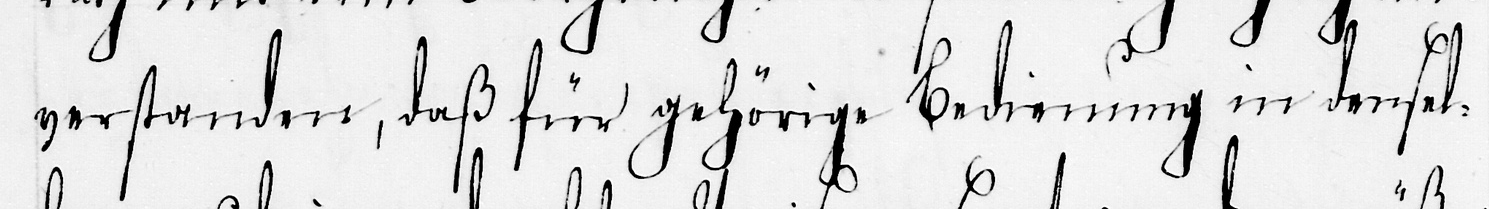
verstanden, daß für gehörige Bedienung in densel¬
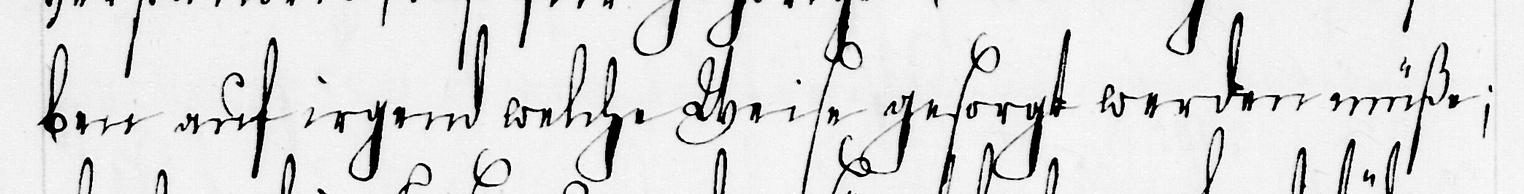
ben auf irgend welche Weise gesorgt werden müße;
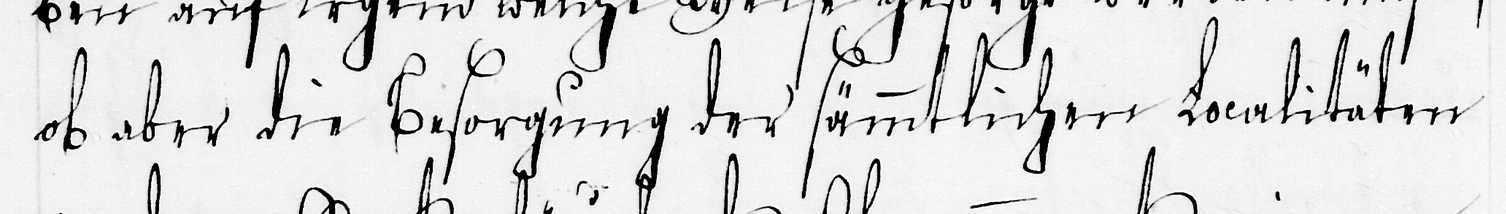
ob aber die Besorgung der sämmtlichen Localitäten
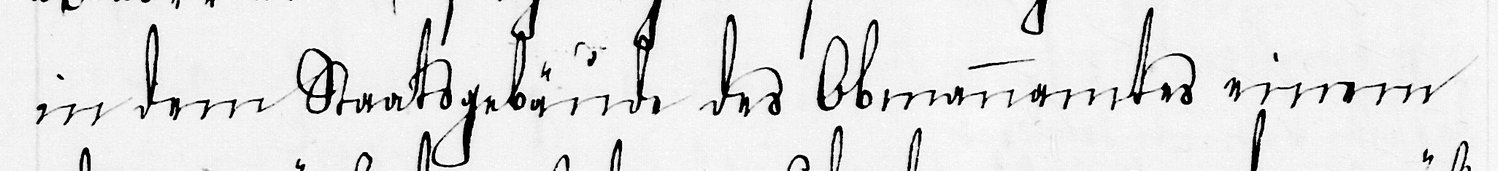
in dem Staatsgebäude des Obmannamtes einem
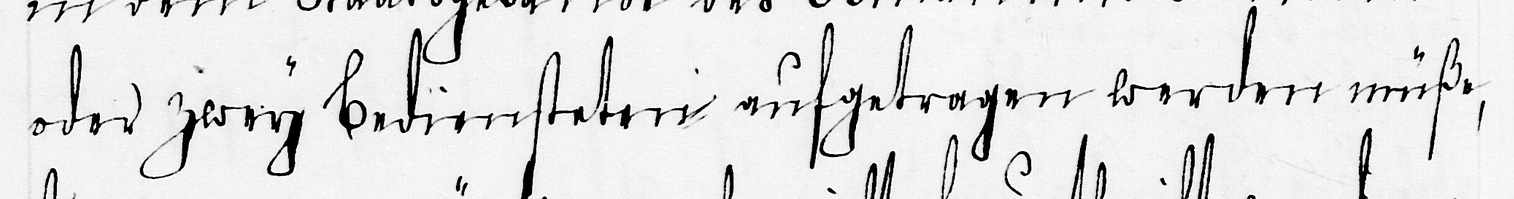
oder zwey Bediensteten aufgetragen werden müße,
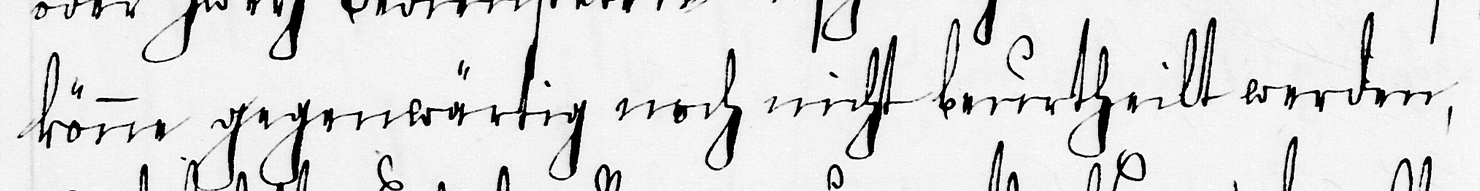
könne gegenwärtig noch nicht beurtheilt werden,
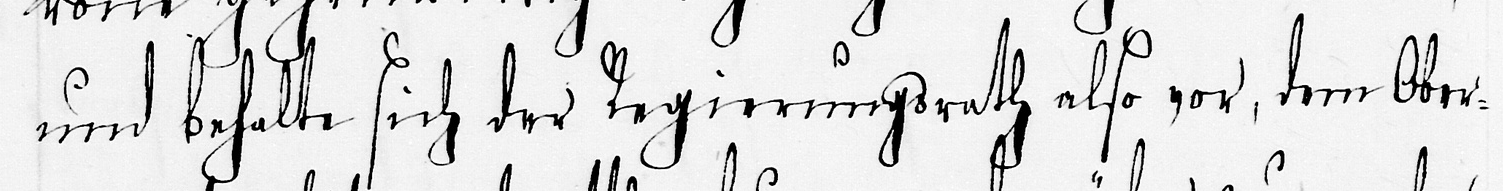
und behalte sich der Regierungsrath also vor, dem Ober¬
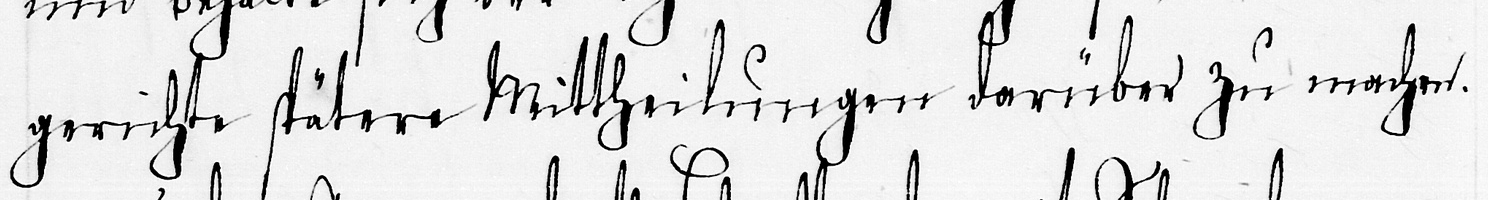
gerichte spätere Mittheilung darüber zu machen.
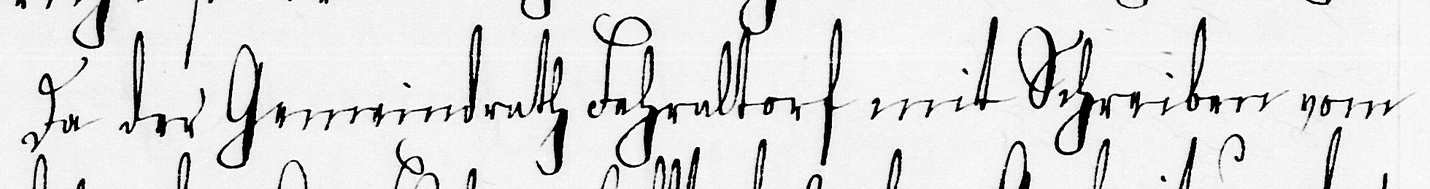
Da der Gemeindrath Fehraltorf mit Schreiben vom
